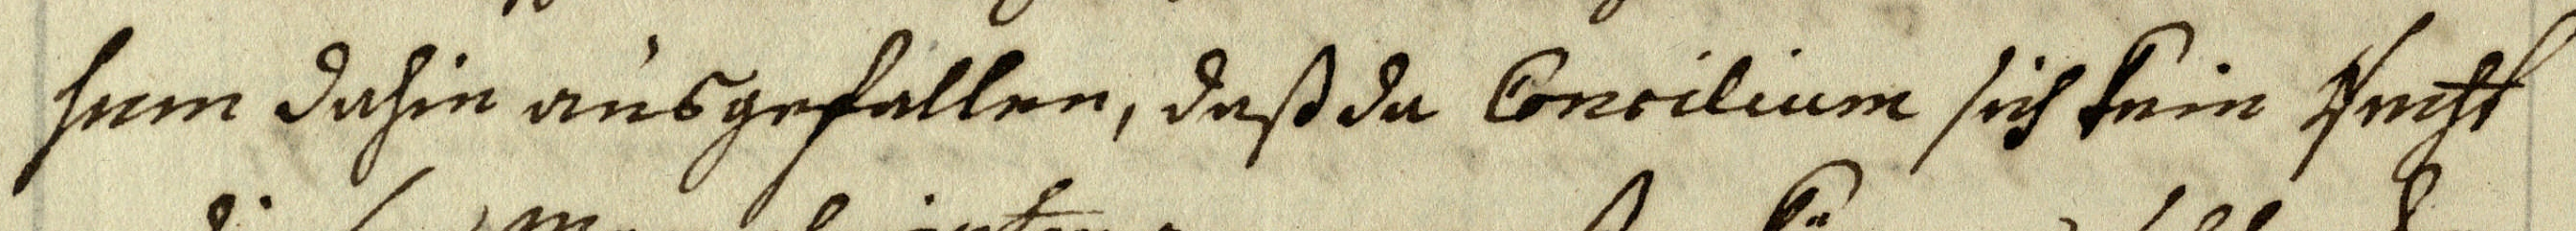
sum dahin ausgefallen, daß da Concilium sich kein Recht
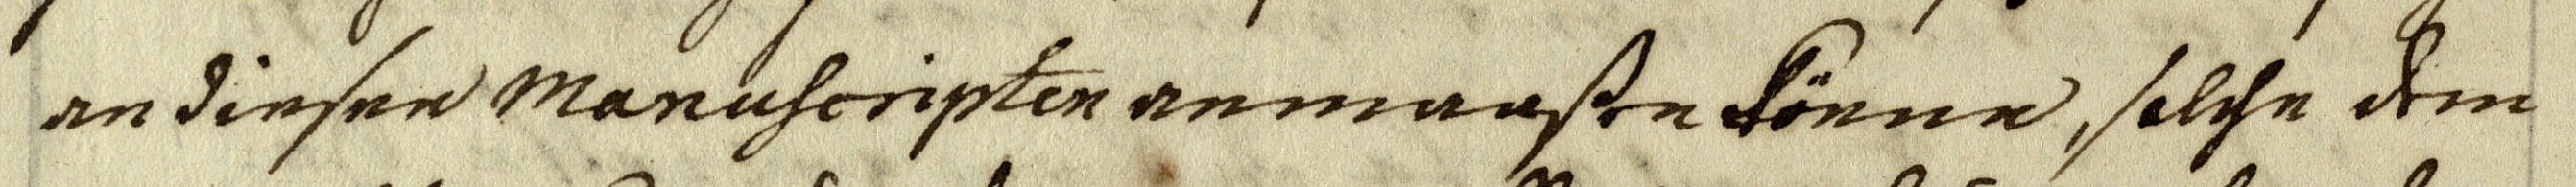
an diesen Manuscripten anmaaßen könne, solche dem
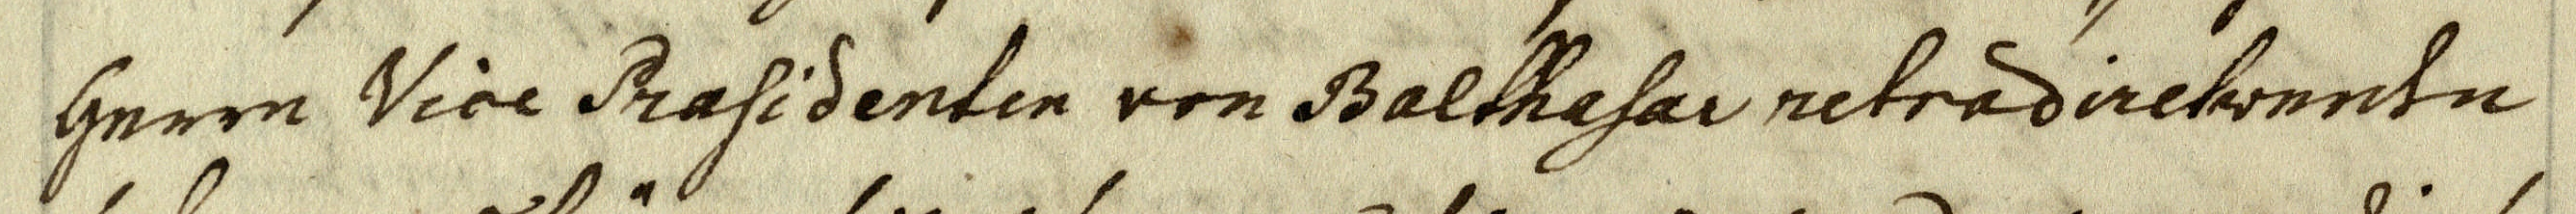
Herrn Vice Prasidenten von Balthasar retradiret werden
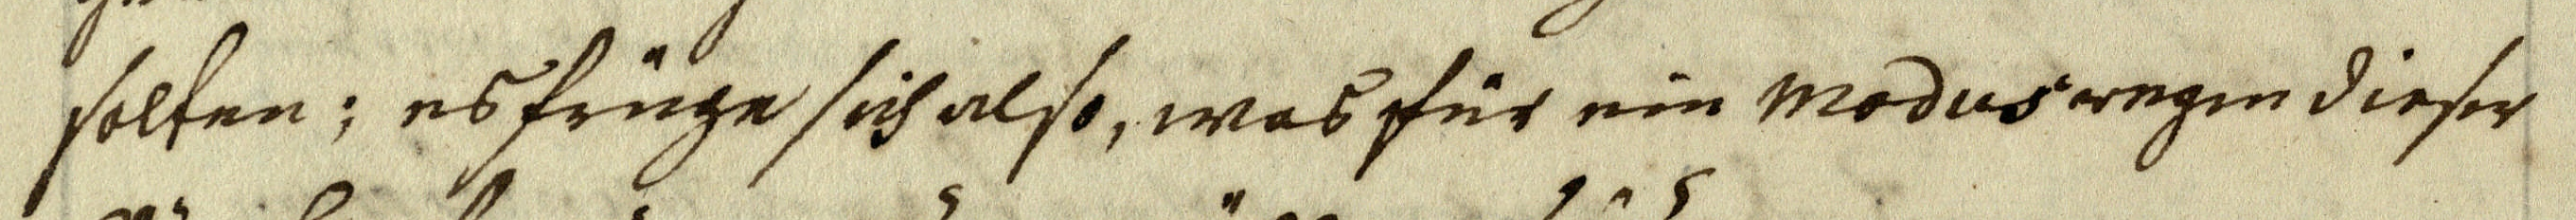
solten; es früge sich also, was für ein Modus wegen dieser
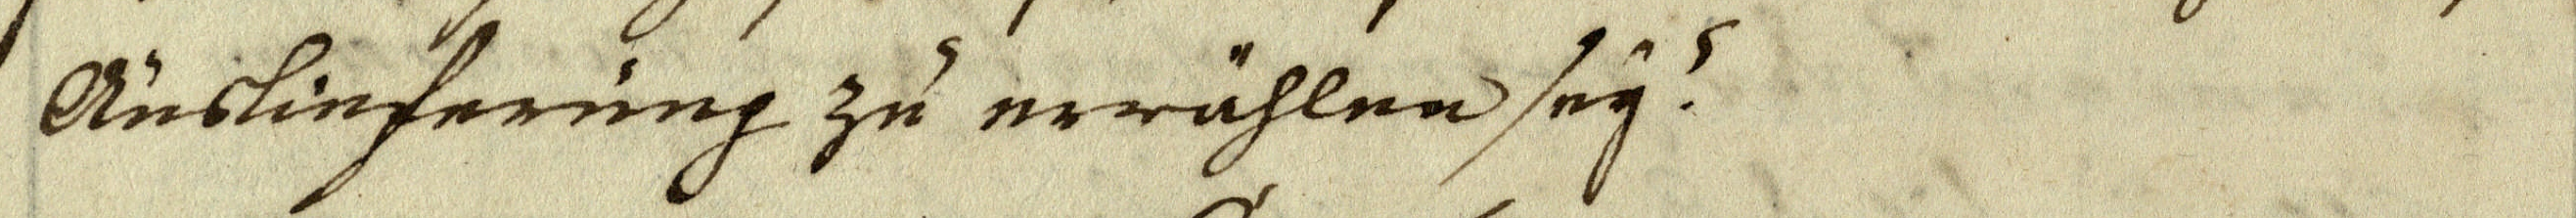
Auslieferung zu erwählen seÿ!
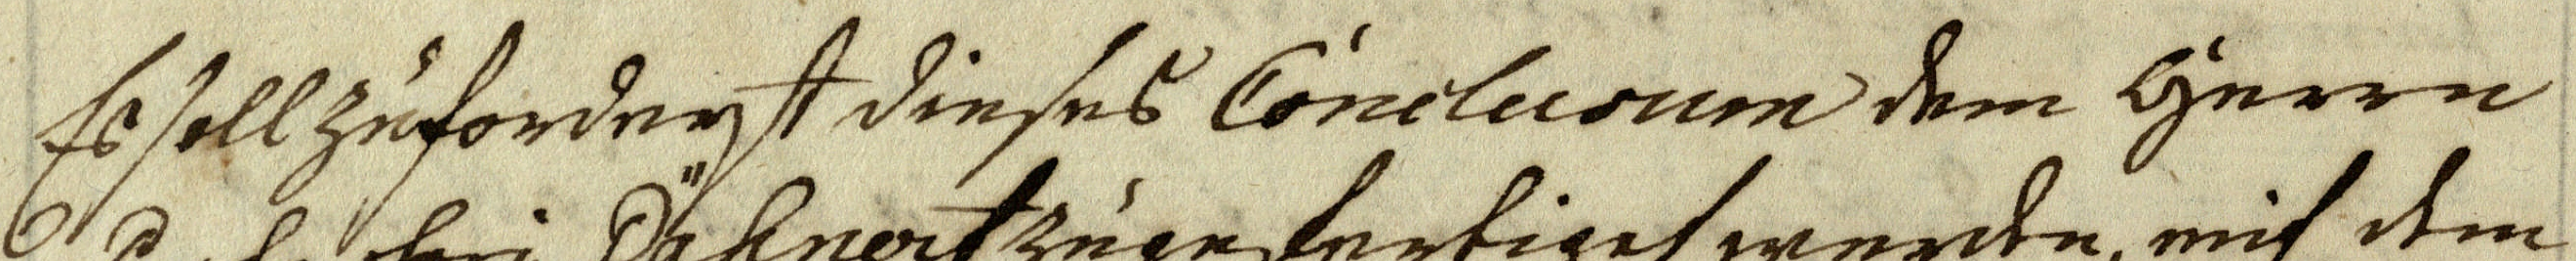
Es soll zuforderst dieses Conclusum dem Herrn
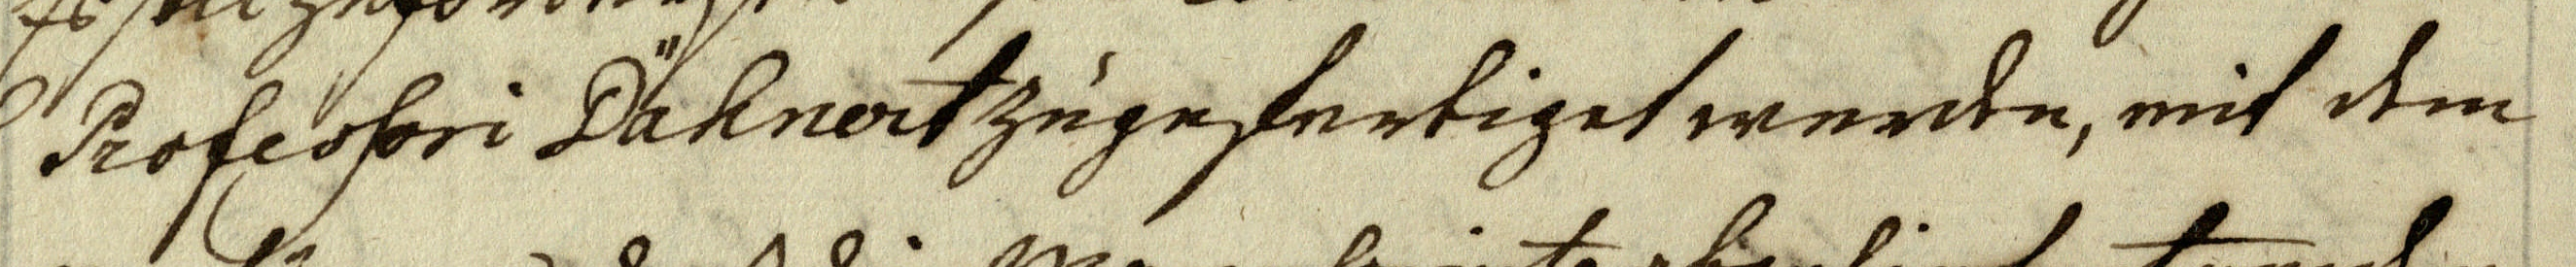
Professori Dähnert zugefertiget werden, mit dem
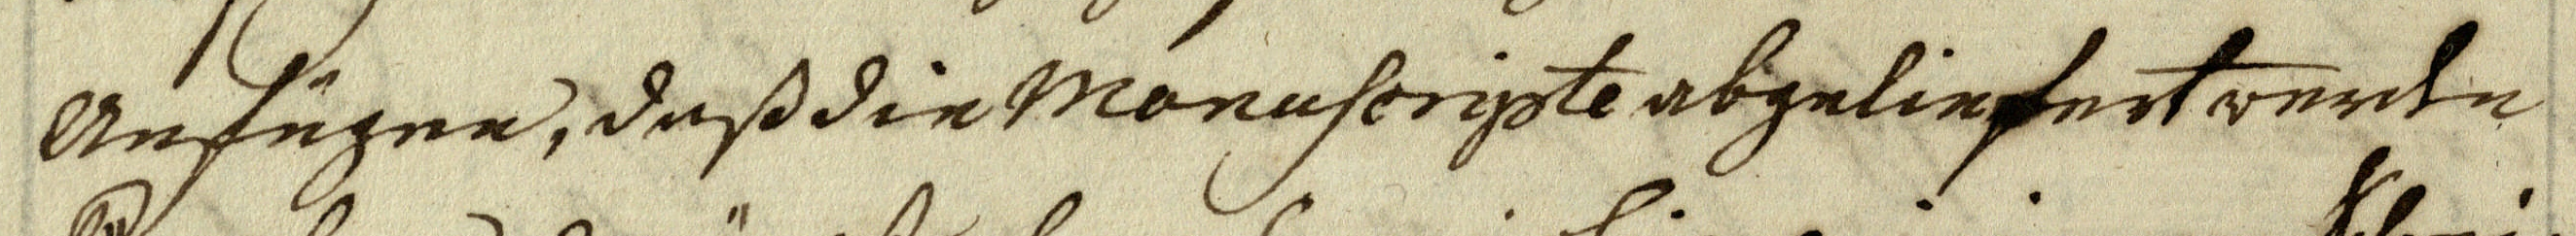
Anfügen, daß die Manuscripte abgeliefert werden
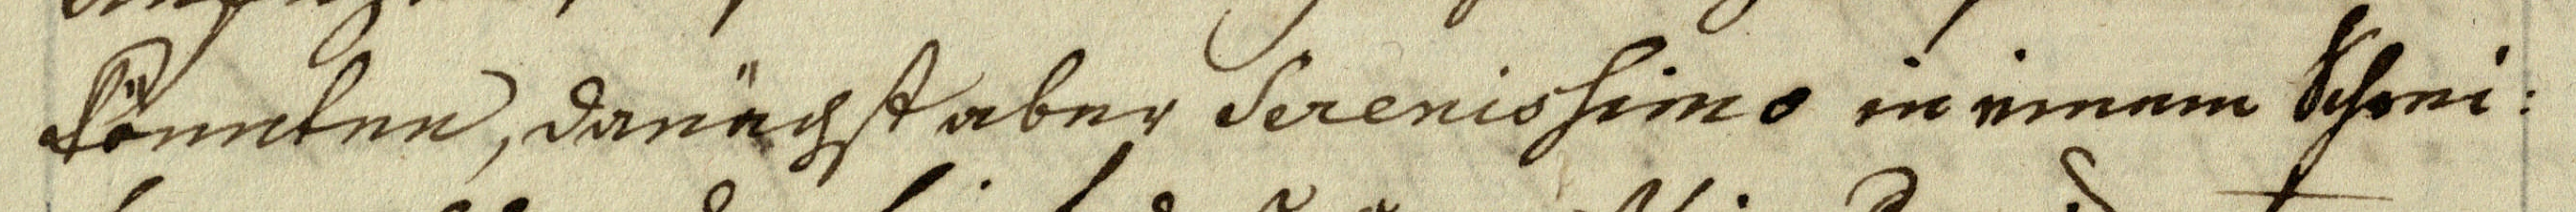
könnten, danächst aber Serenissimo in einem Schrei¬
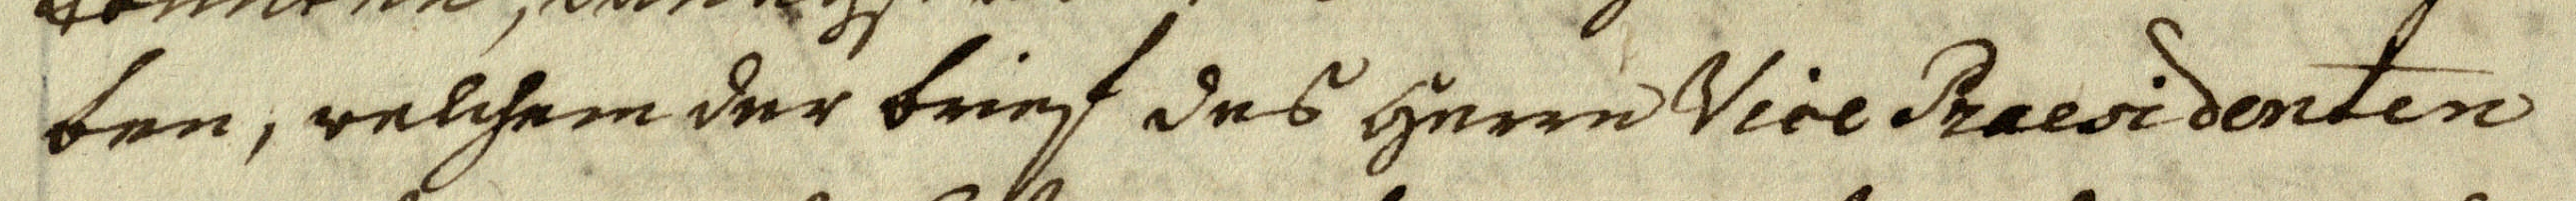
ben, welchem der Brief des Herrn Vice Praesidenten
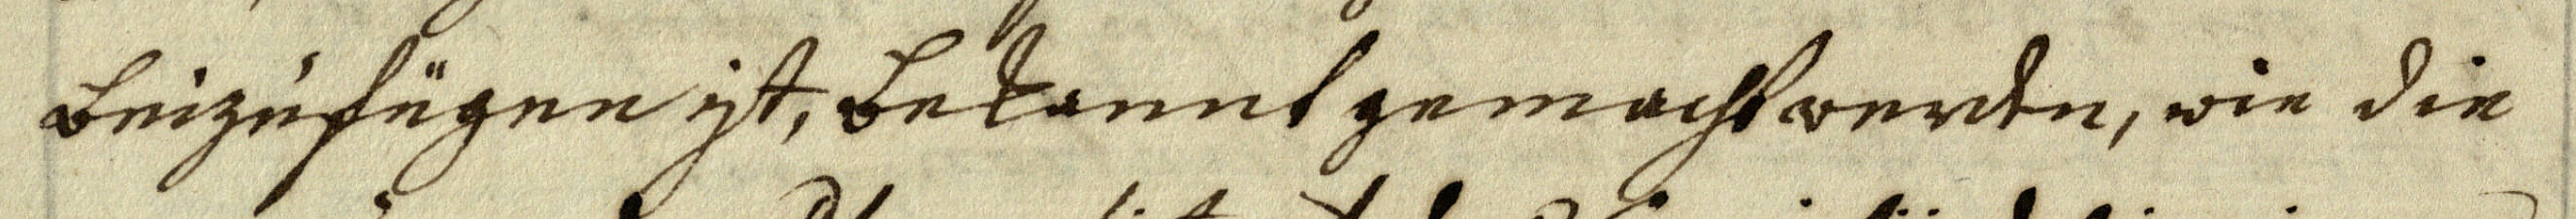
beizufügen ist, bekannt gemacht werden, wie die
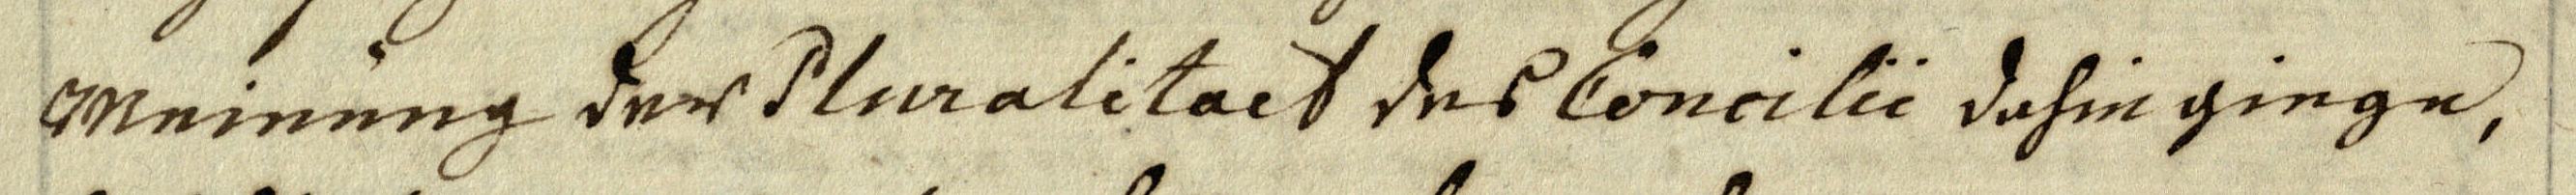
Meinung der Pluralitaet des Concilii dahin ginge,
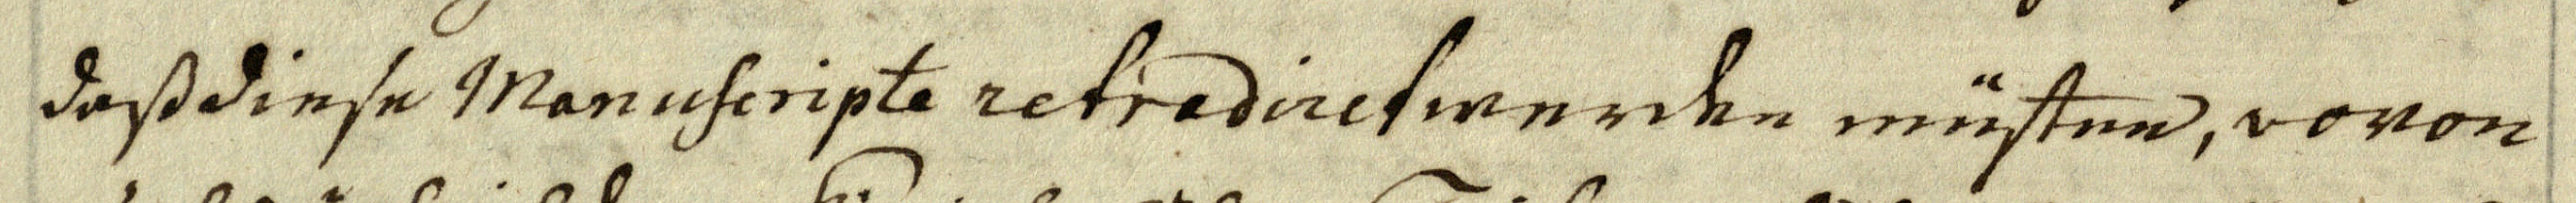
daß diese Manuscripte retradiret werden müsten, wovon
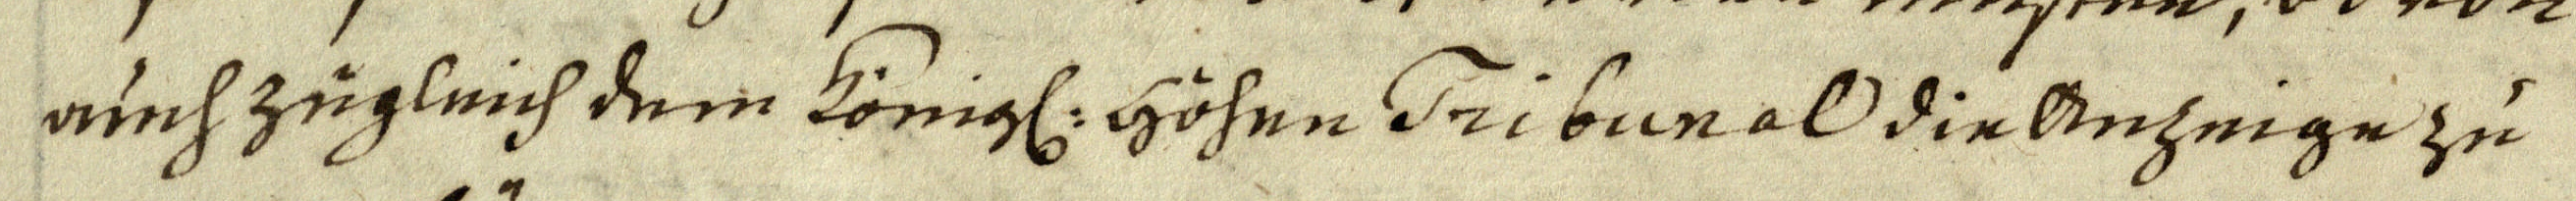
auch zugleich dem Königl. Hohen Tribunal die Anzeige zu
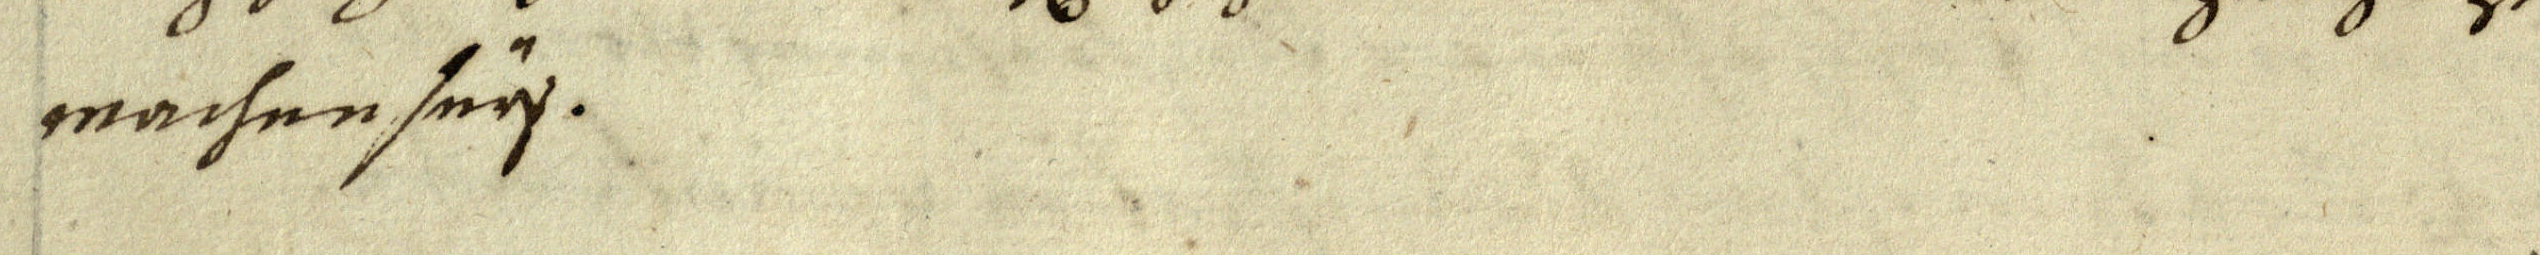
machen seÿ.
